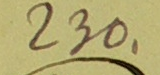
230
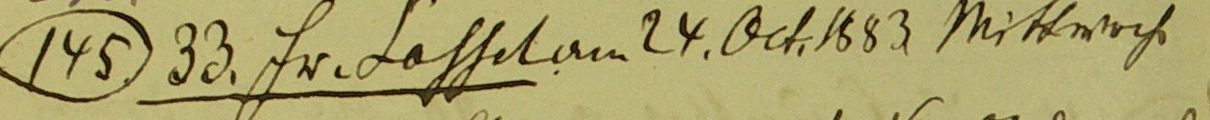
145. 33) Fr. Lassel am 24. Oktob. 83 Mittwoch
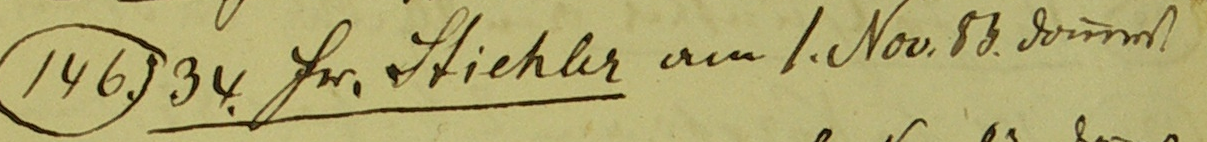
146. 34) Fr. Stiehler am 1. Nov. 83 Donnerstag
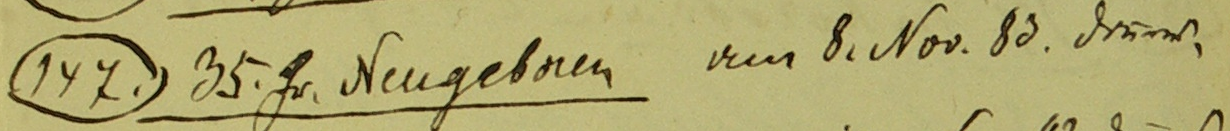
147. 35) Fr. Neugeboren am 8. Nov. 83 Donnerstag
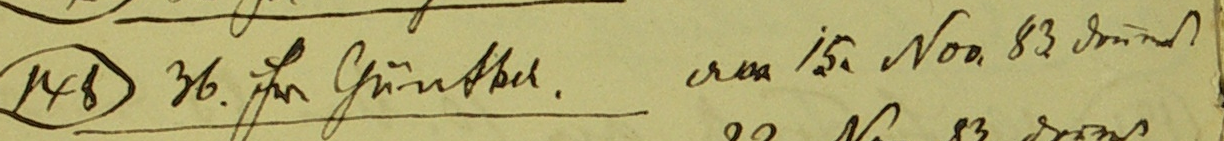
148. 36) Fr. Günther am 15.Nov. 83 Donnerstag
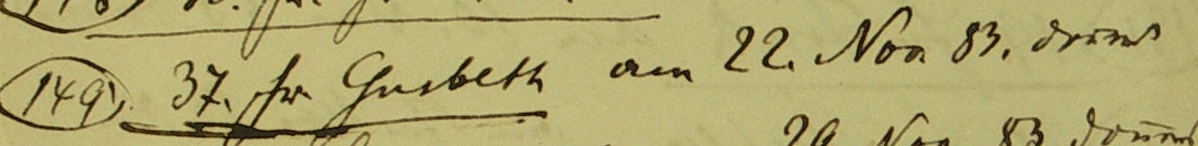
149. 37) Fr. Gusbeth am 22. Nov. 83 Donnerstag
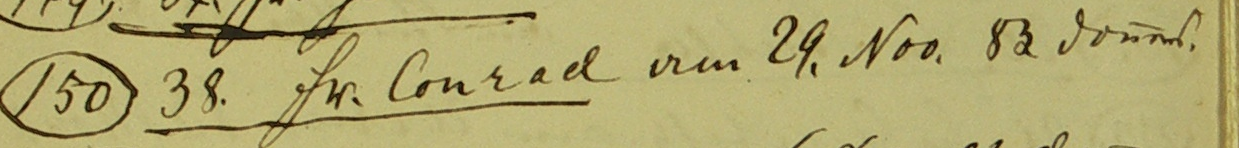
150. 38) Fr. Conrad am 29. Nov. 83 Donnerstag
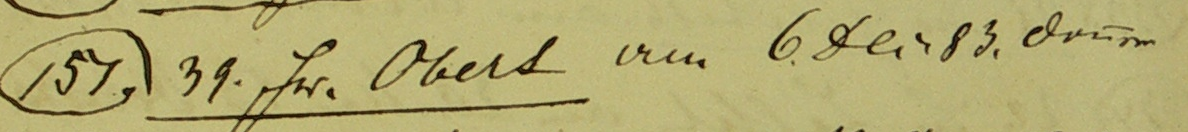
151. 39) Fr. Obert am 6. Dez. 83 Donnerstag
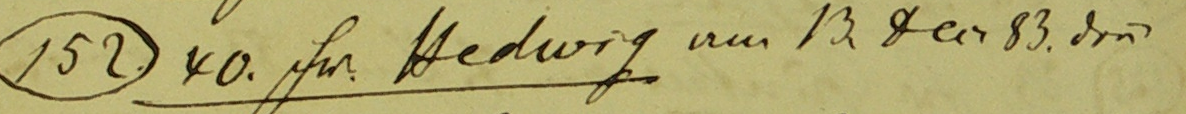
152. 40) Fr. Hedwig am 13. Dez. 83 Donnerstag
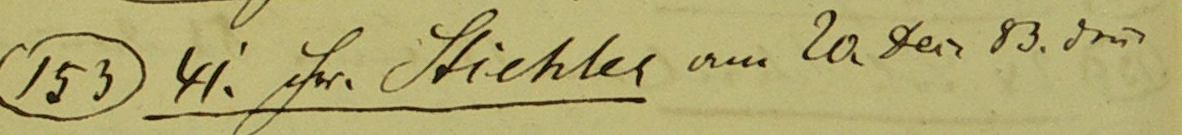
153. 41) Fr. Stiehler am 20. Dez. 83 Donnerstag
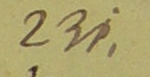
231
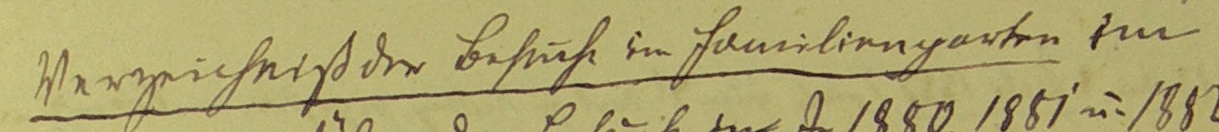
Verzeichniß der Besuche im Familiengarten im
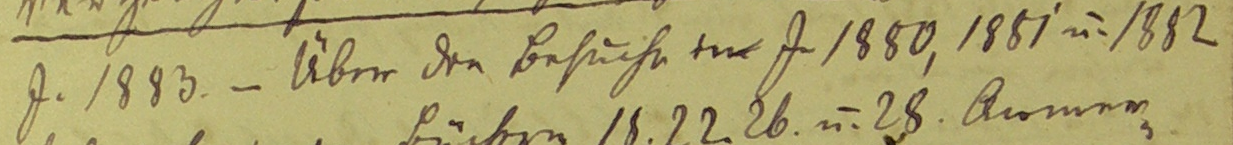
Jahre 1883 . Über die Besuche in Jahren 1880, 1881 und 1882
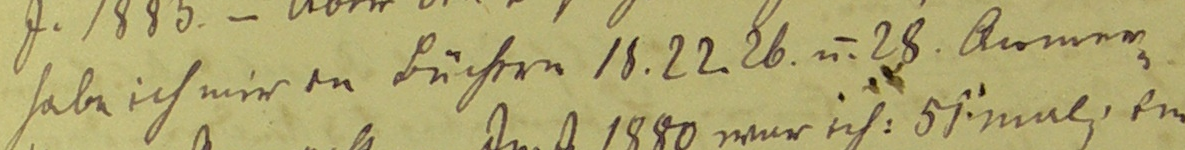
habe ich mir in Büchern 18; 22; 26 und 28 Anmer¬
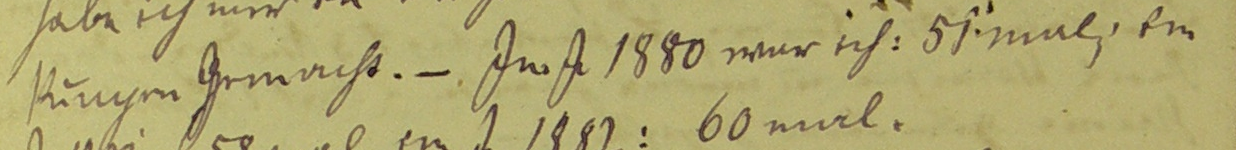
kungen gemacht.- Im Jahre 1880 war ich : 51 mal, im
